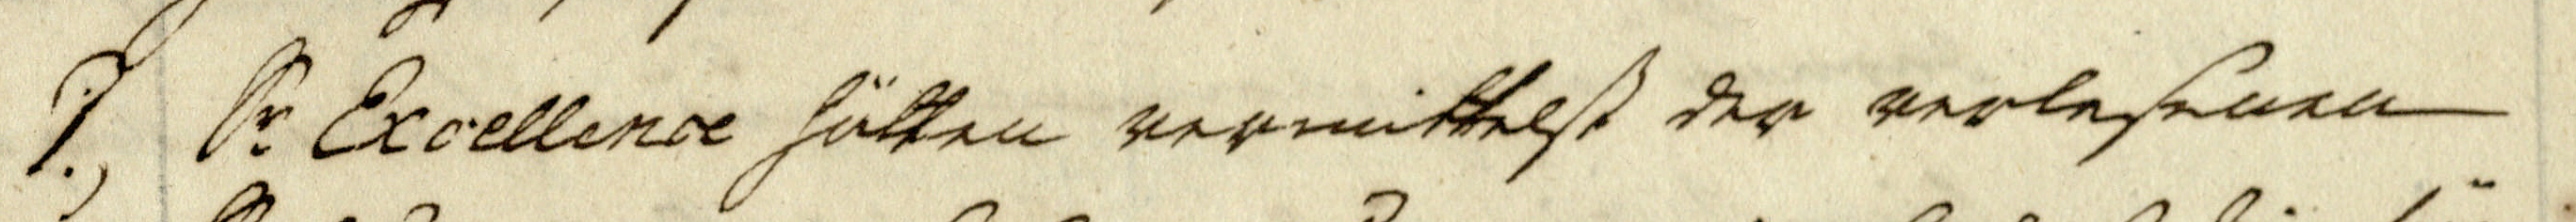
1., Sr. Excellence hätten vermittelst der verlesenen
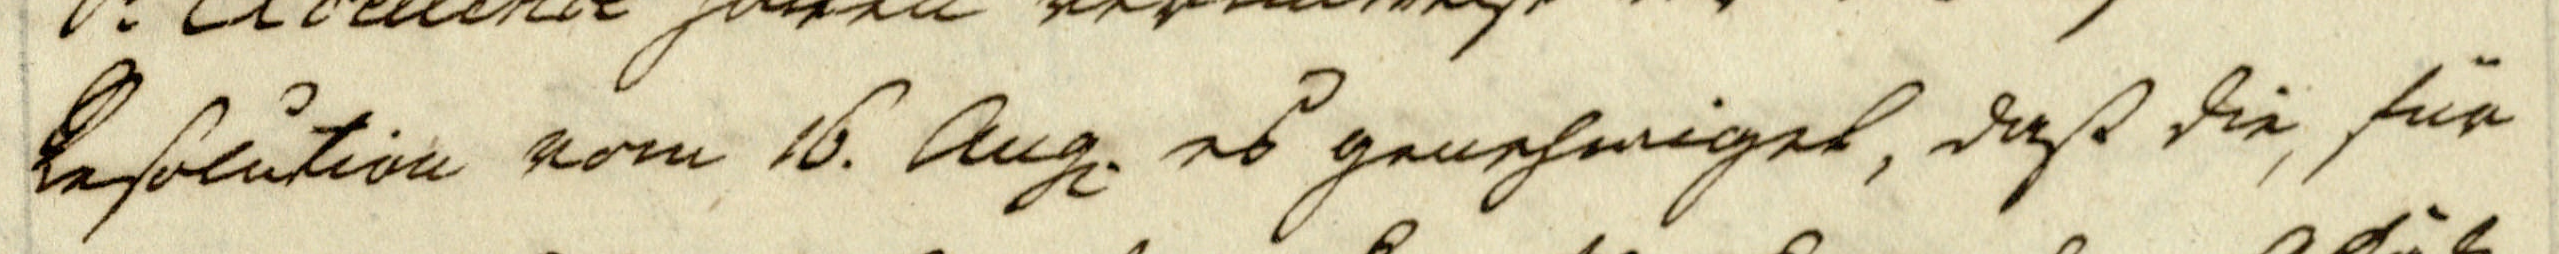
Resolution vom 16. Aug. es genehmiget, daß die, für
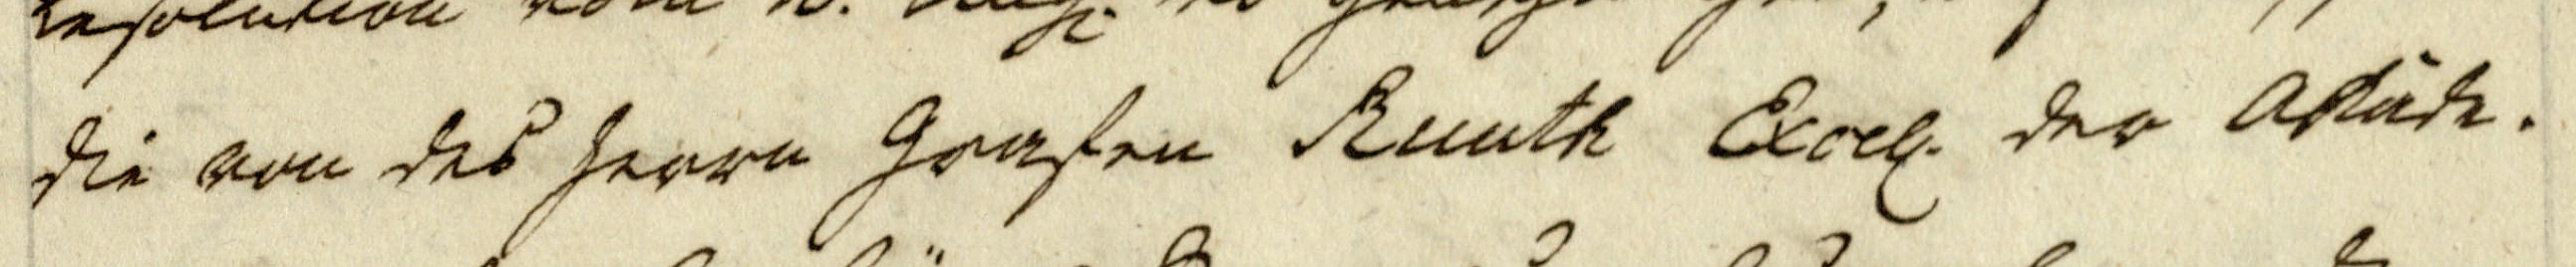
die von des herrn Grafen Ruuth Excel. der Akade¬
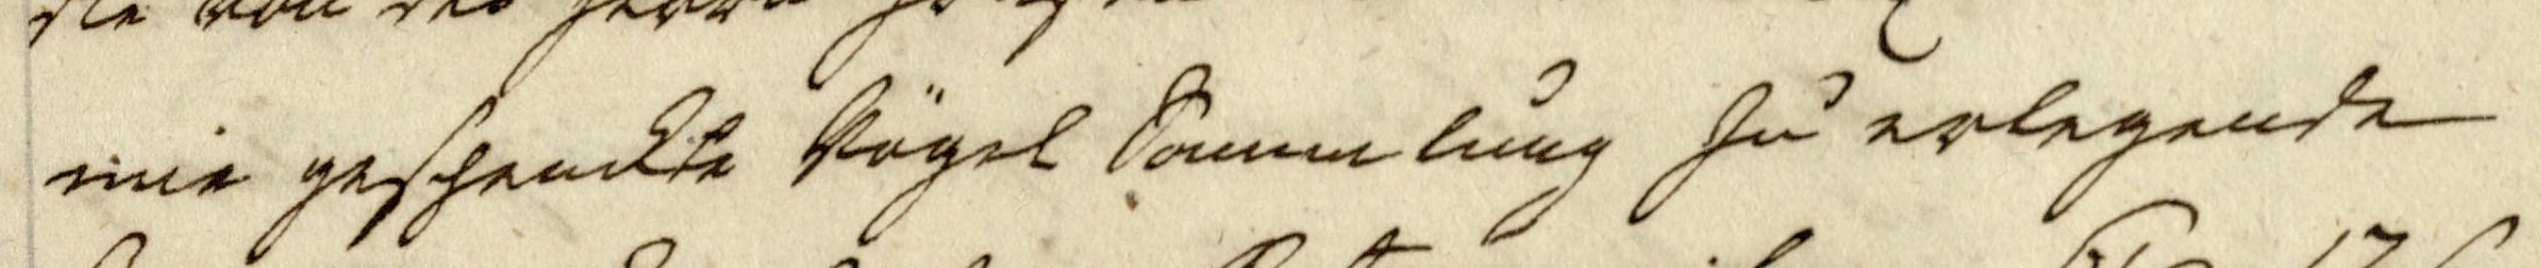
mie geschenckte Vögel Sammlung zu erlegende
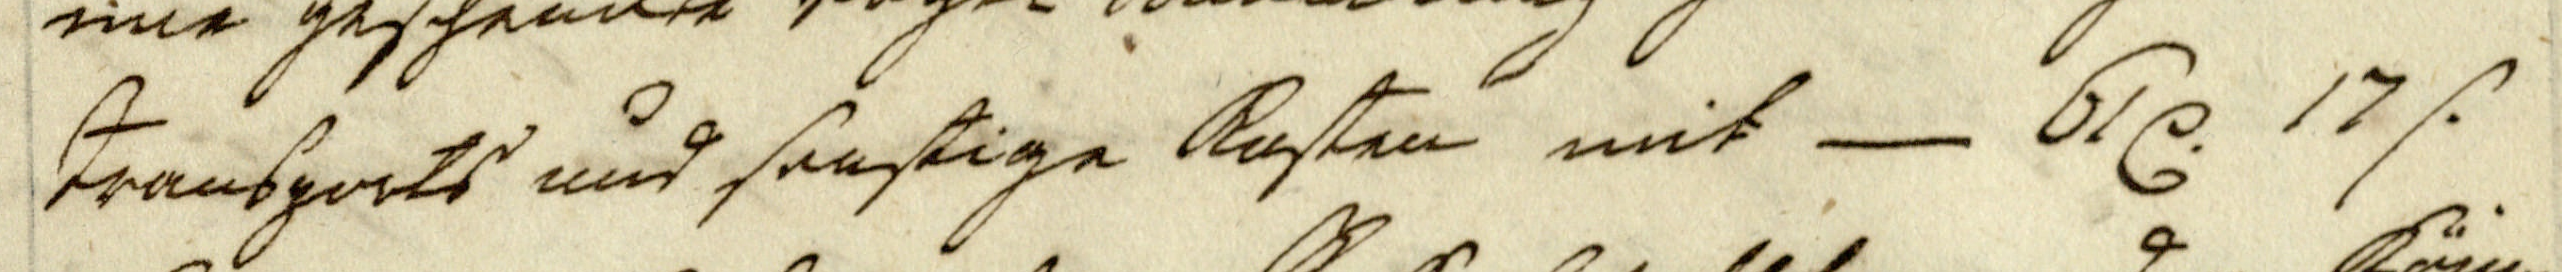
Transports und sonstige Kosten mit 61 l. 17 s.
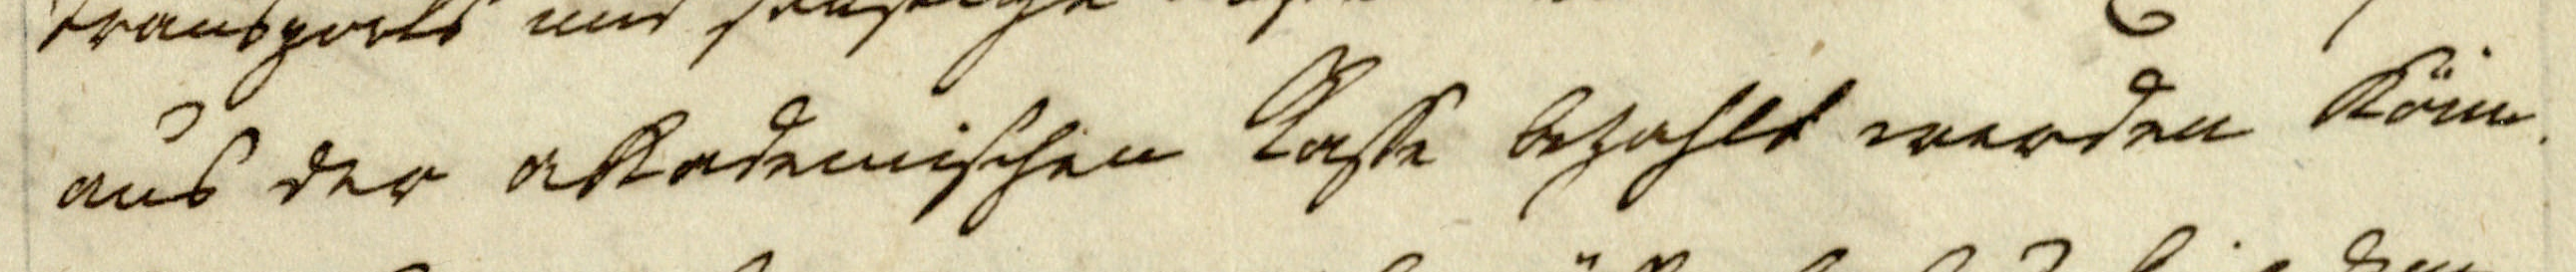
aus der akademischen Kasse bezahlt werden könn¬
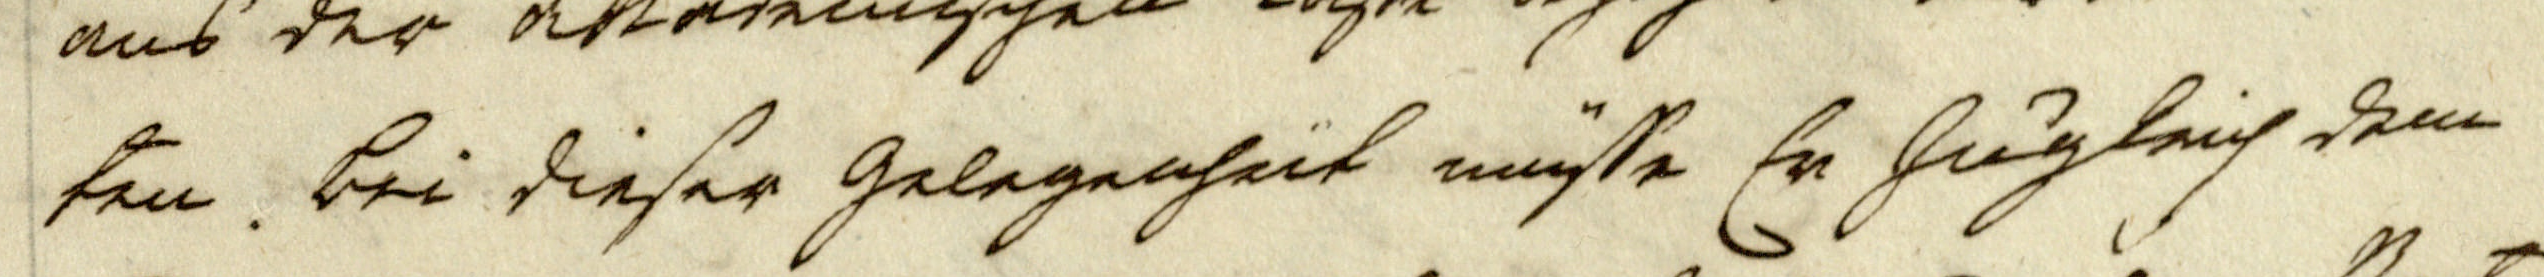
ten. Bei dieser Gelegenheit müsse Er zugleich dem
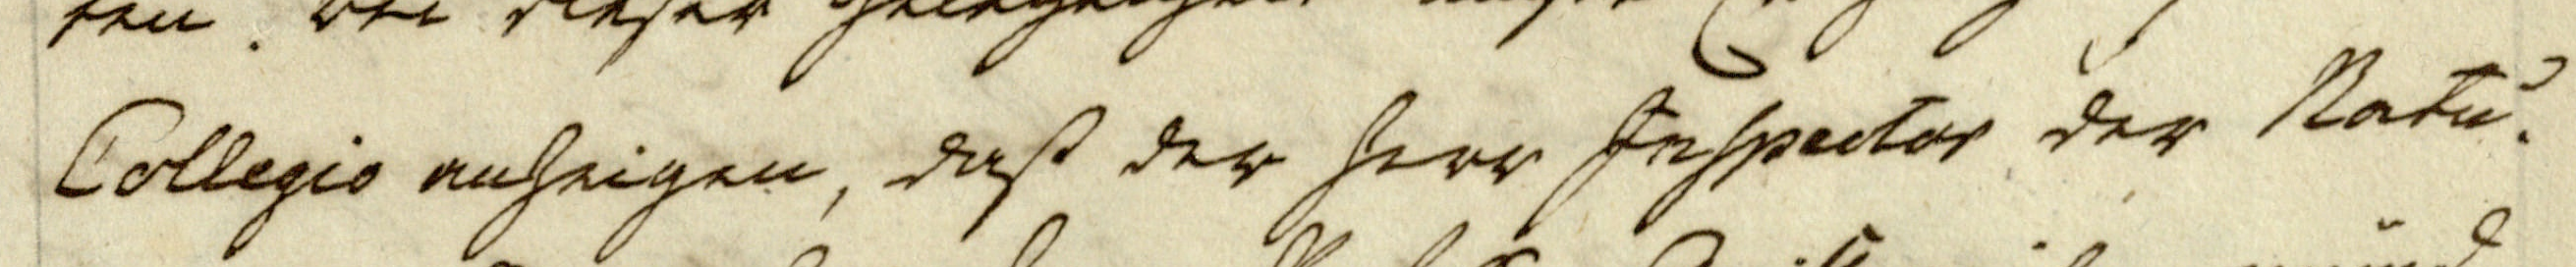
Collegio anzeigen, daß der herr Inspector der Natu¬
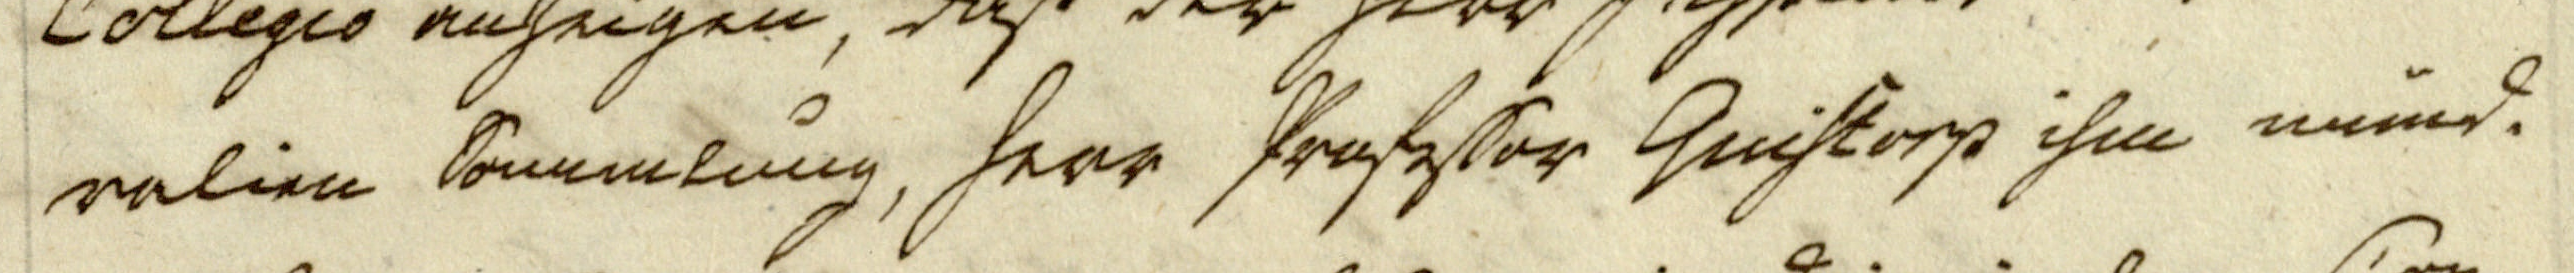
ralien Sammlung, herr Professor Quistorp ihm münd¬
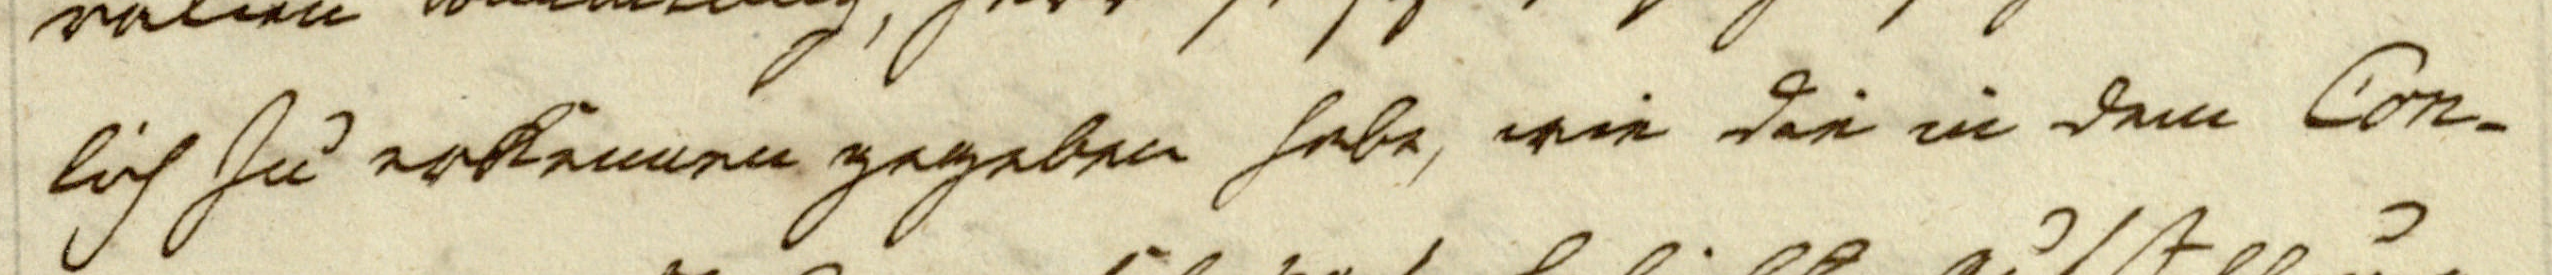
lich zu erkennen gegeben habe, wie die in dem Con¬
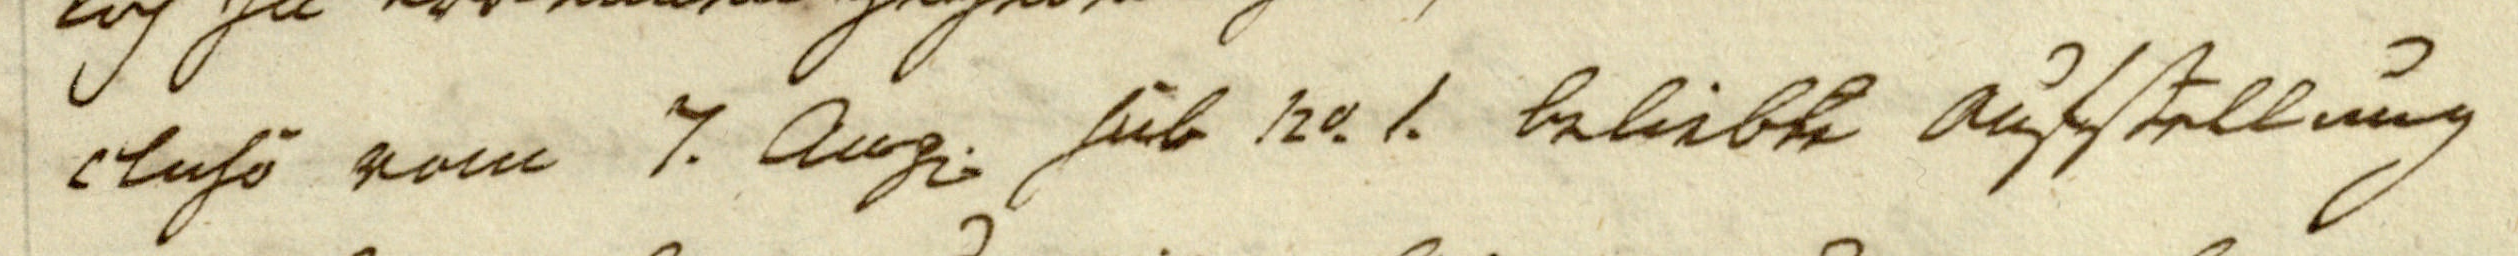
cluso vom 7. Aug. sub no. 1 beliebte Aufstellung
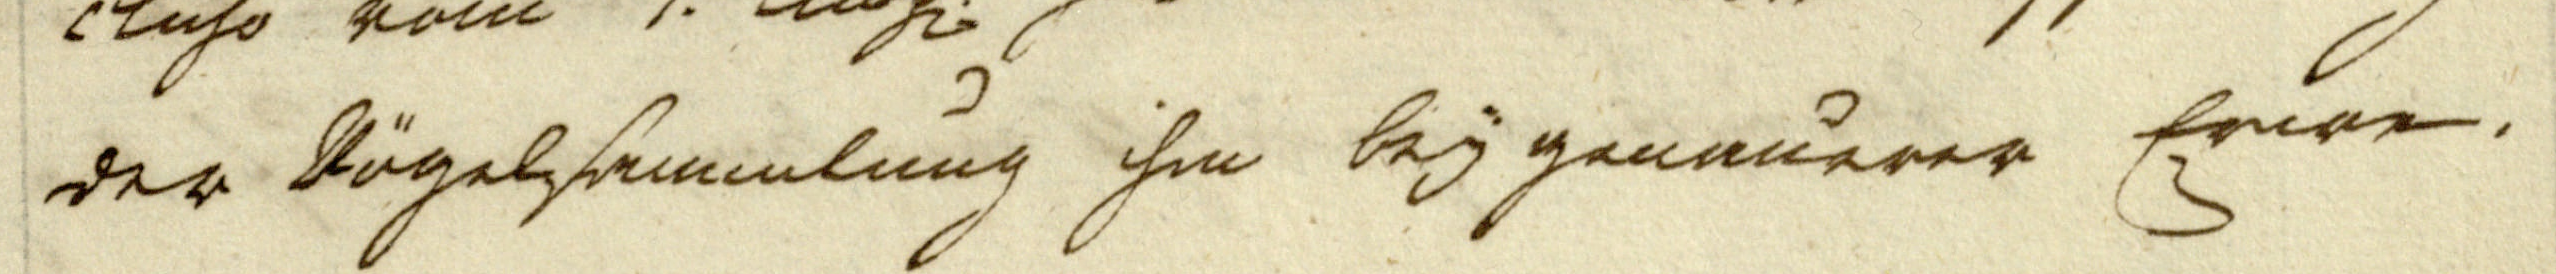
der Vögelsammlung ihn beÿ genauerer Erwe¬
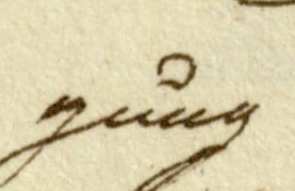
gung
